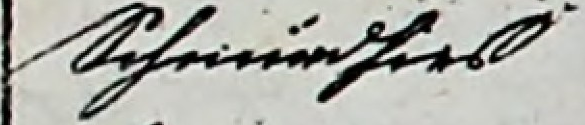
Schmundhers
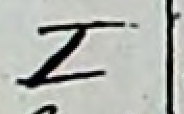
I
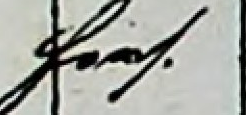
hens.
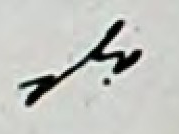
do
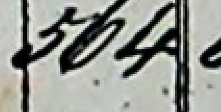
564
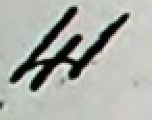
41
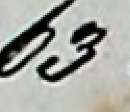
63
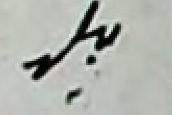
do
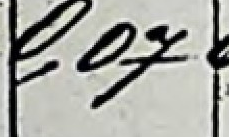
0,07
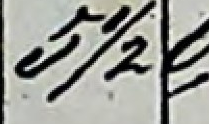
5 1/2
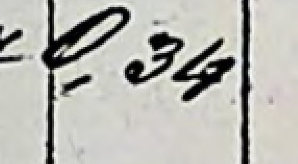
0,34
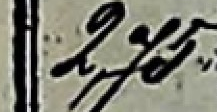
2,75
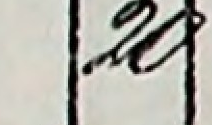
20
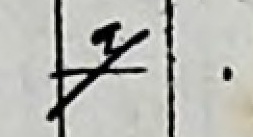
7
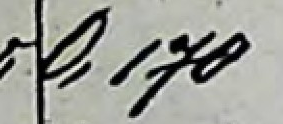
0,170
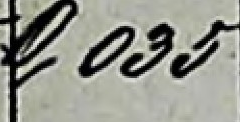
0,035
